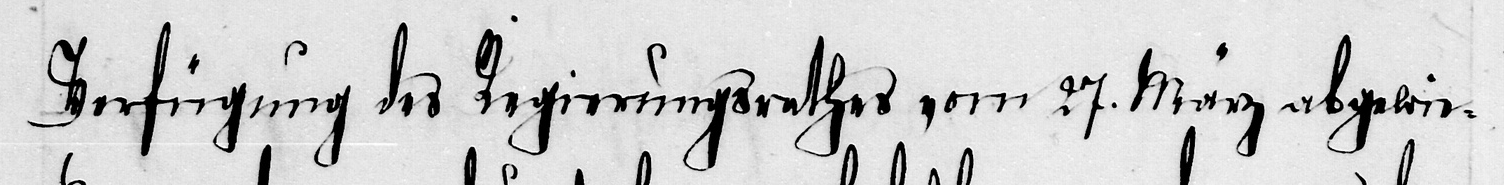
Verfügung des Regierungsrathes vom 27. März abgewie¬
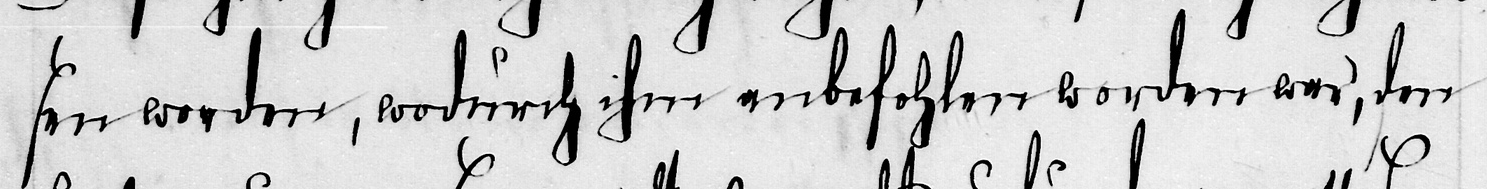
sen worden, wodurch ihm anbefohlen worden war, den
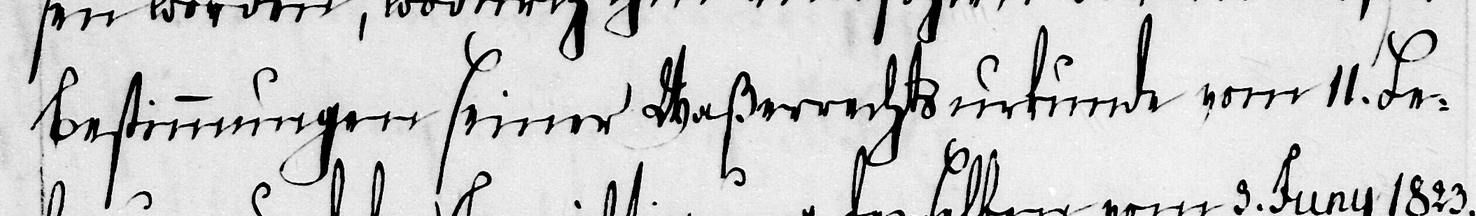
Bestimmungen seiner Waßerrechtsurkunde vom 11. Fe¬
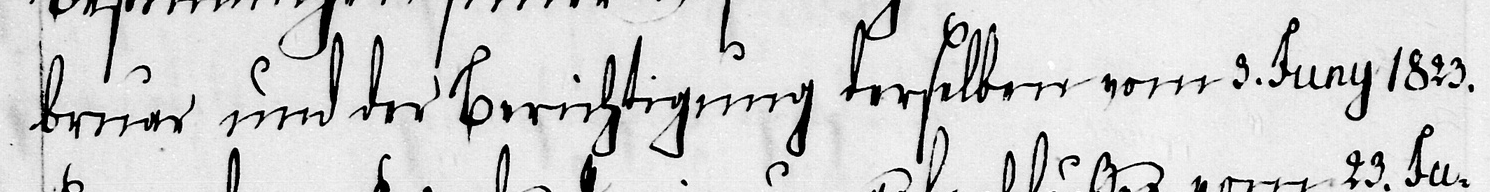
bruar und der Berichtigung derselben vom 3. Juny 1823.
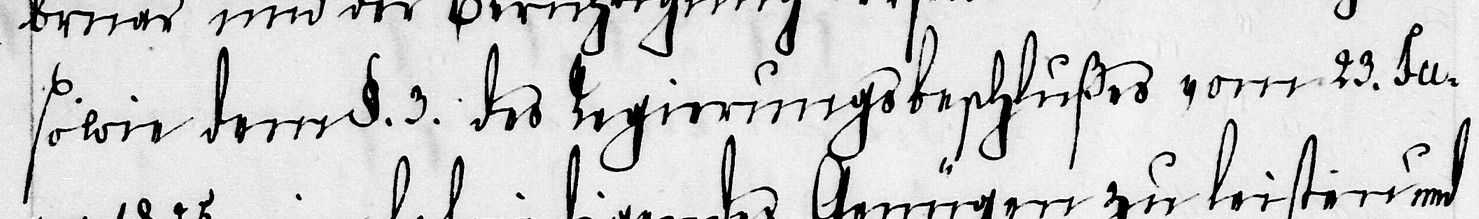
sowie dem §. 3. des Regierungsrathsbeschlußes vom 23.
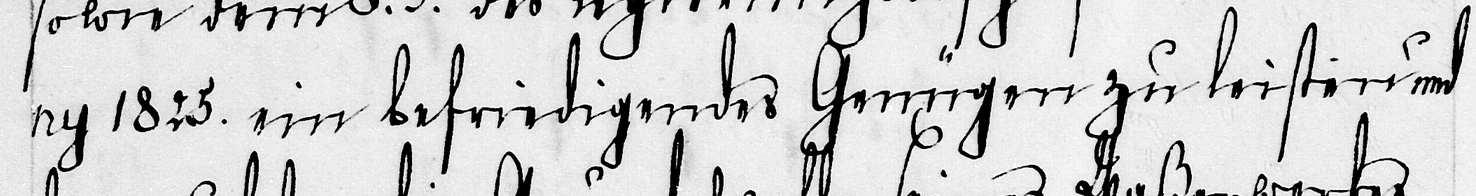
Juny 1825. ein befriedigendes Genügen zu leisten und
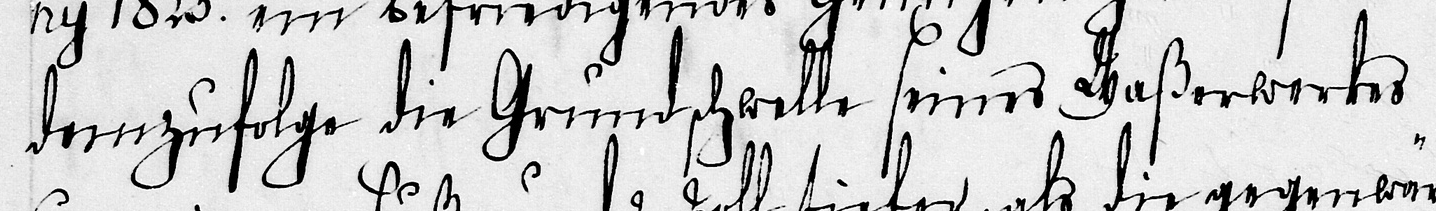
demzufolge die Grundschwelle seines Waßerwerkes
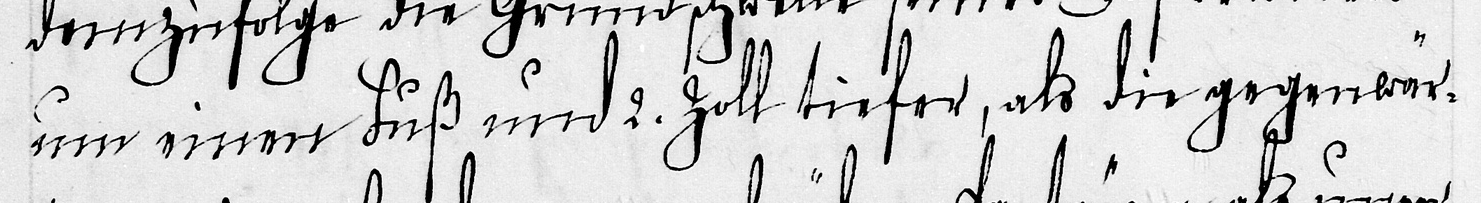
um einen Fuß und 2. Zoll tiefer, als die gegenwär¬
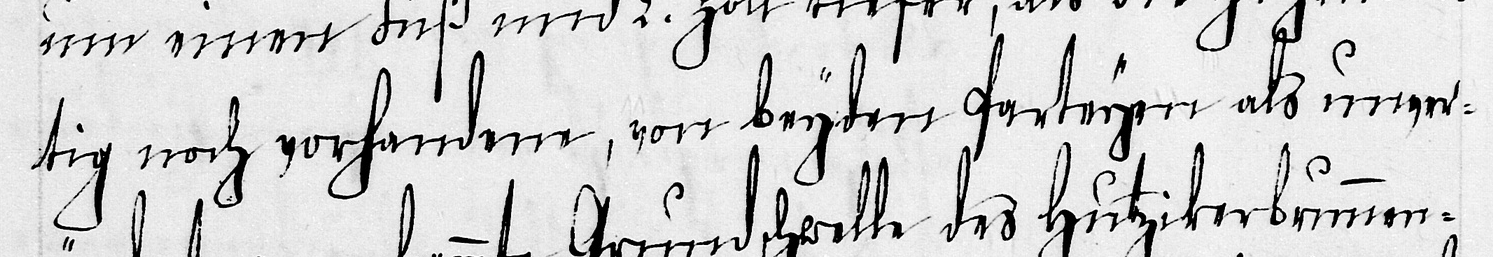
tig noch vorhandene, von beyden Parteyen als unver¬
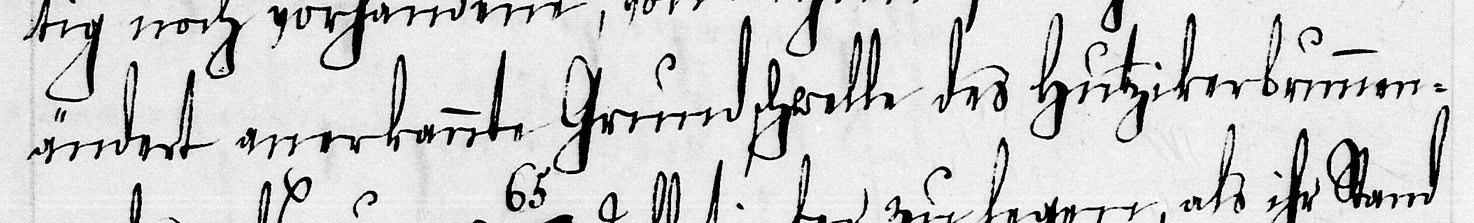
ändert anerkannte Grundschwelle des Hutzikerbrunnen¬
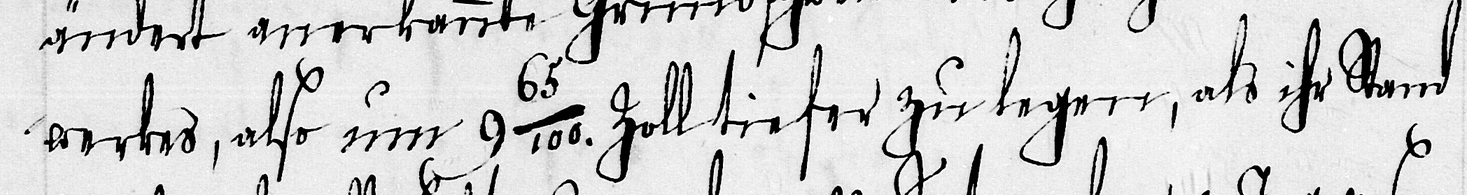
werkes, also um 9 65/100. Zoll tiefer zu legen, als ihr Stand
